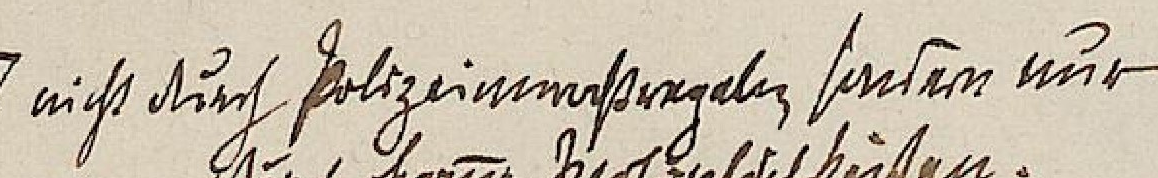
nicht durch Polizeimaßregeln, sondern nur
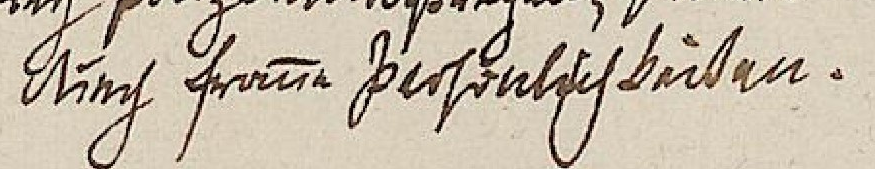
durch frome Persönlichkeiten.
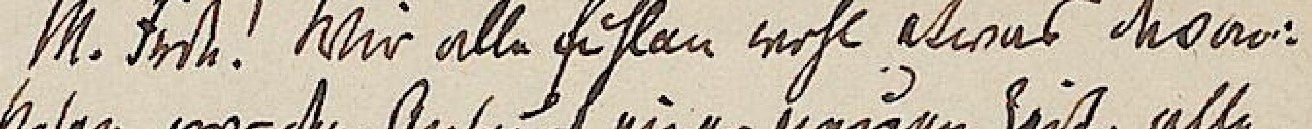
M. Frde! Wir alle fühlen wohl etwas davon:
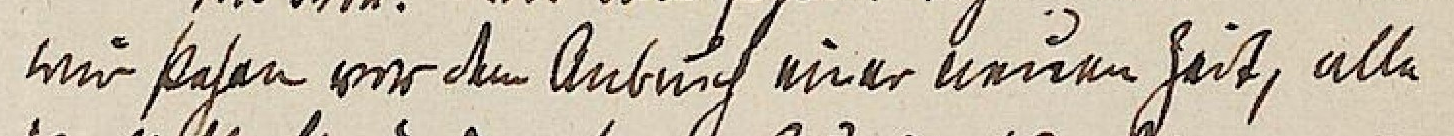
wir stehen vor dem Anbruch einer neuen Zeit, alle
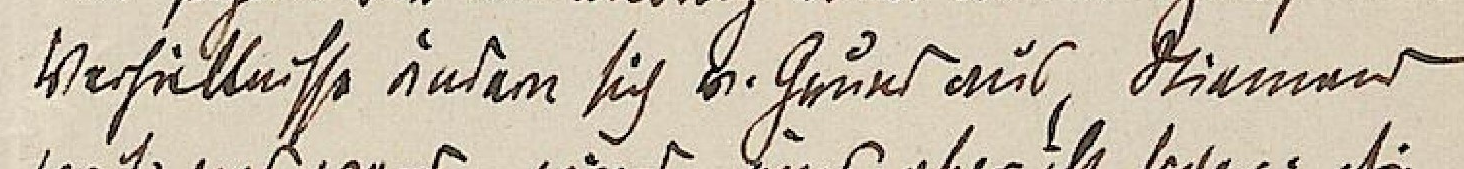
Verhältnisse ändern sich v. Grund aus, Niemand
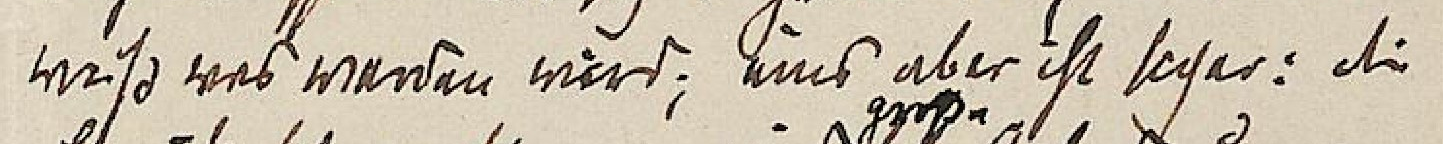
weiß was werden wird; eins aber ist sicher: die
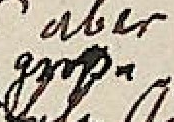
große
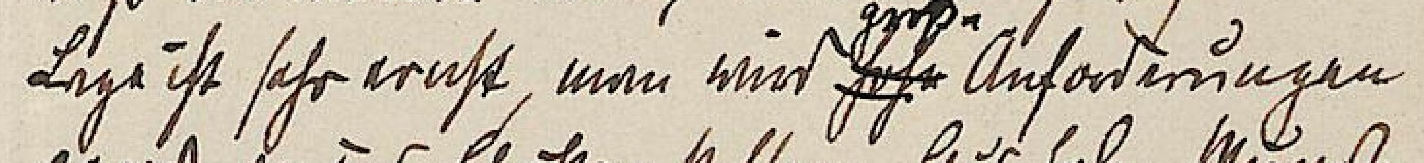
Lage ist sehr ernst, man wird hohe Anforderungen
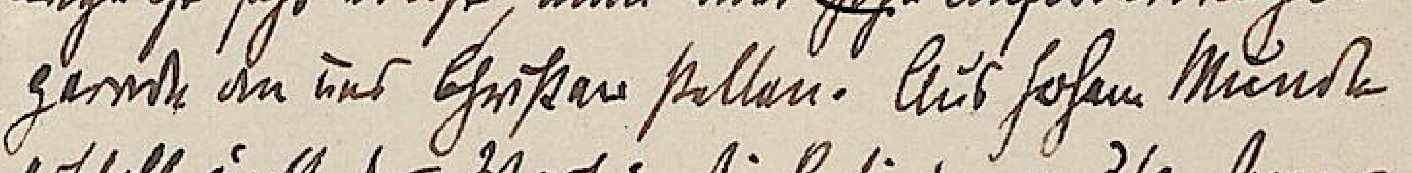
gerade an und Christen stellen. Aus hohem Munde
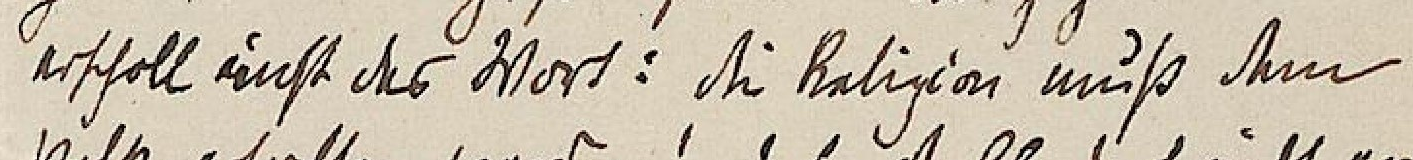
erscholl einst das Wort: die Religion muß dem
